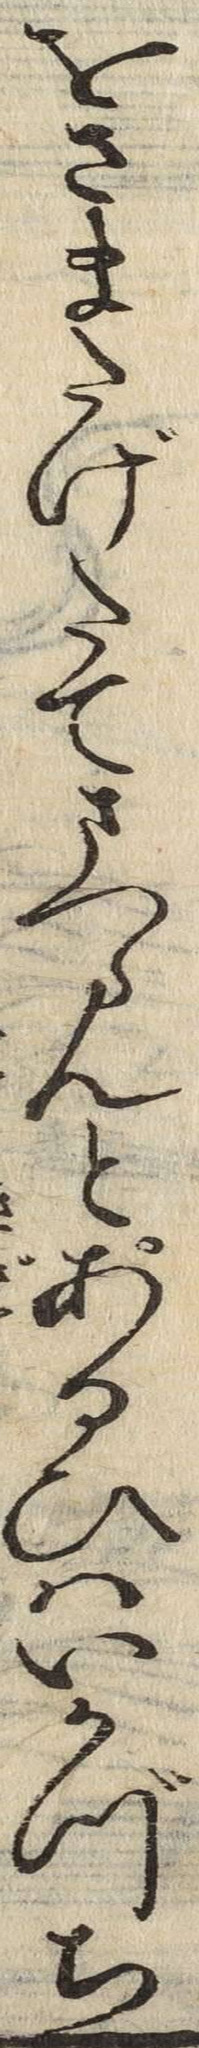をさまたげたてまつらんと。あるひはいかづち
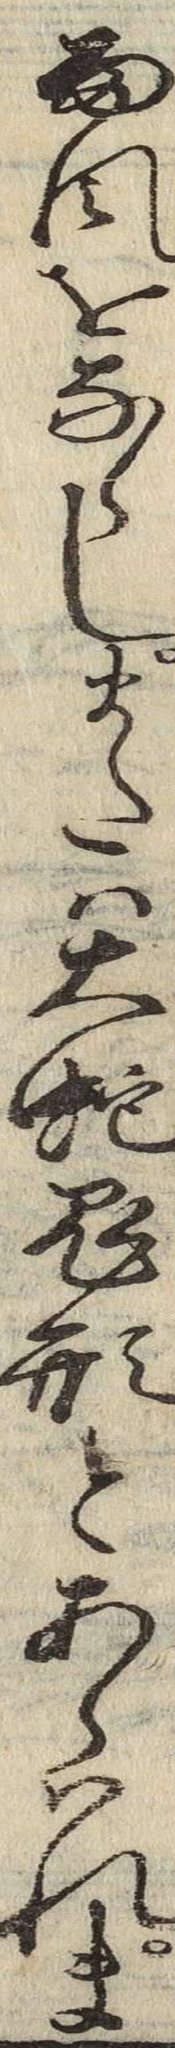雨風をならし。または大蛇鬼形とあらはれ。ま
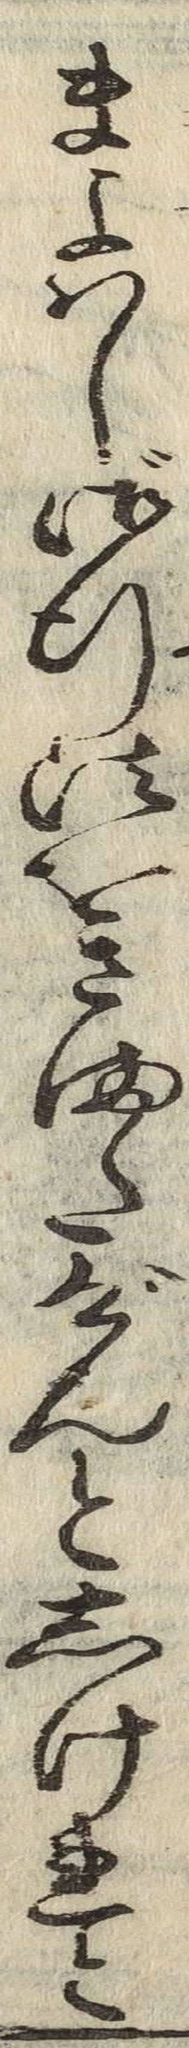まよはし。御行をさまたげんとしけれと
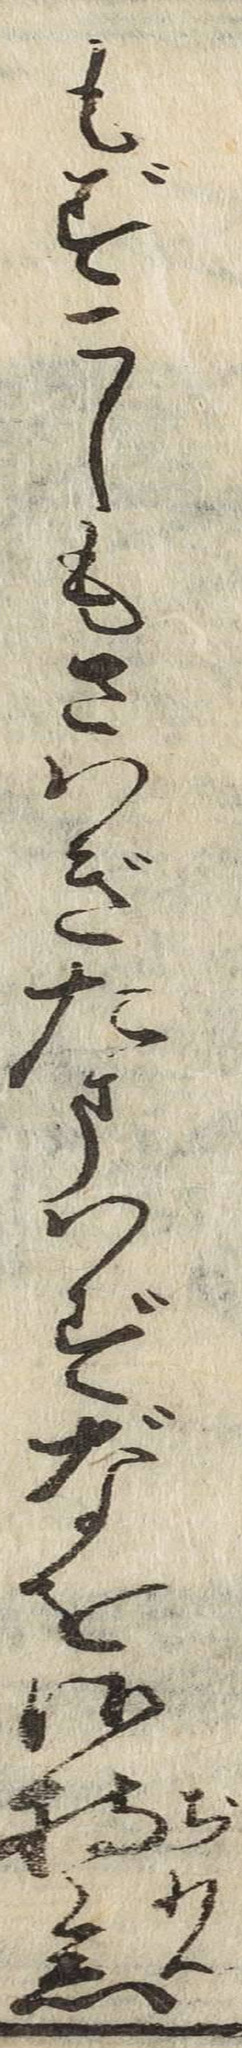も。すこしもさはぎたまはず。なを御持念
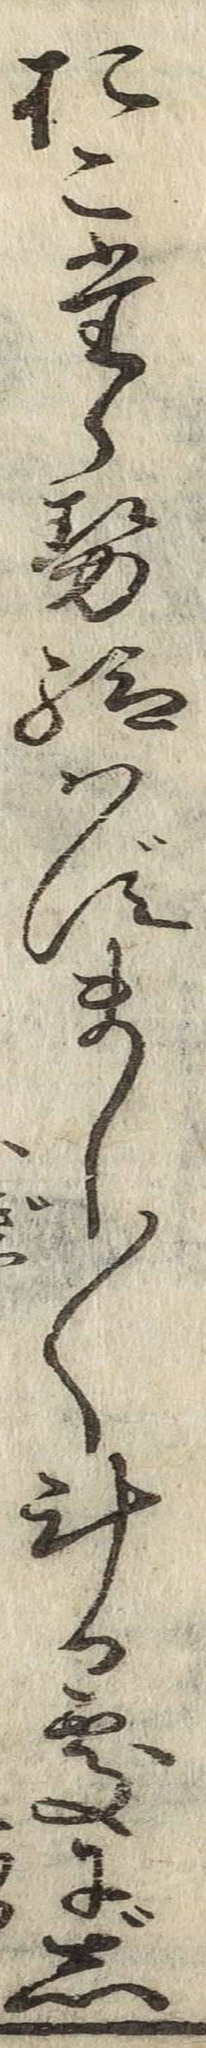おこたらせ給はずまし〳〵ける処に。し
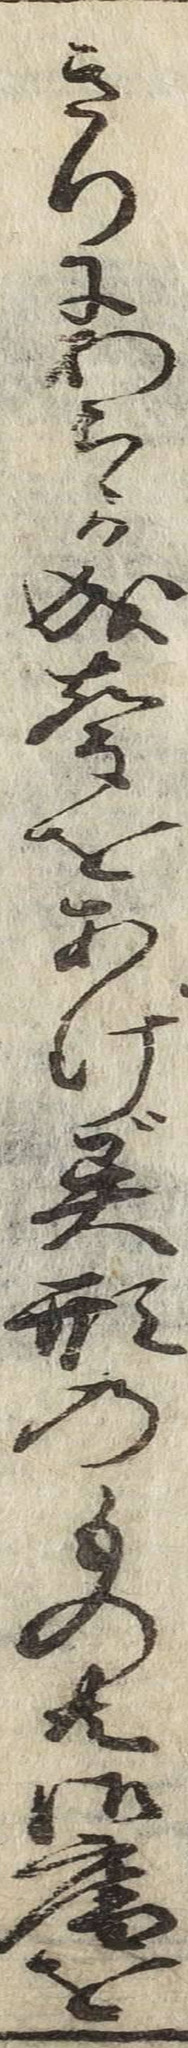きりにあらゝか成声をあげ。異形のもの共御庵を
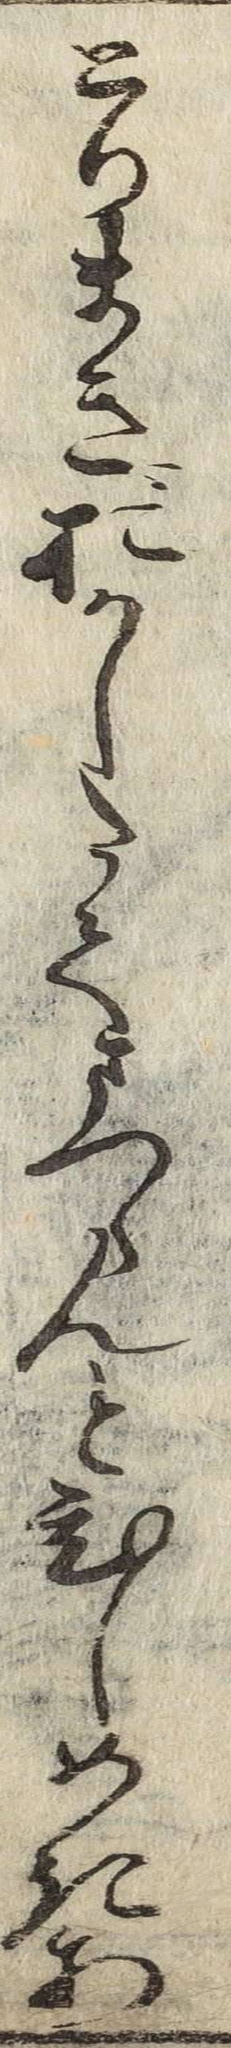とりまき。おかしたてまつらんとひしめきあ

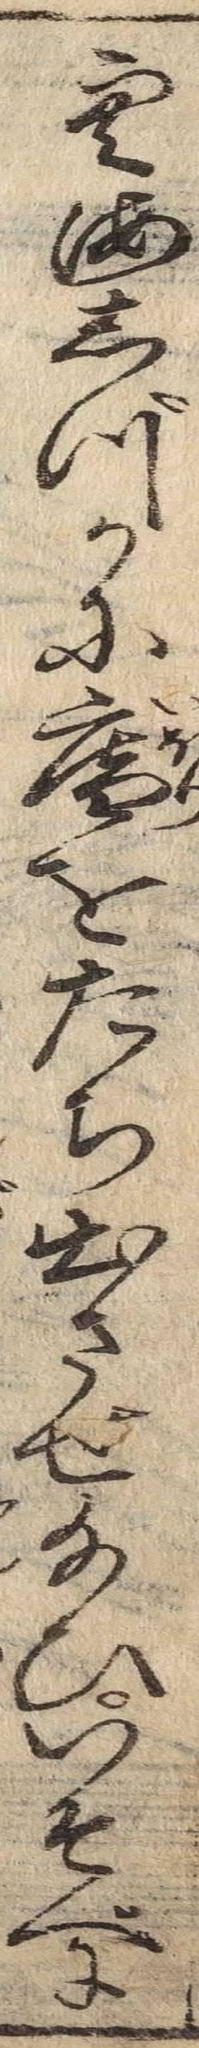空海しづかに庵をたち出させ給ひ。いそべに
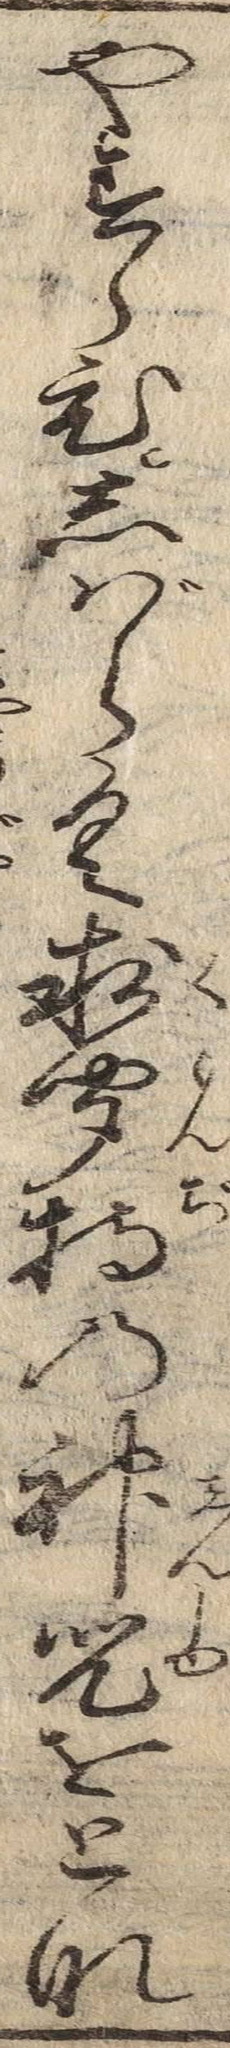やすらひ。しばらく求聞持の神呪をとな
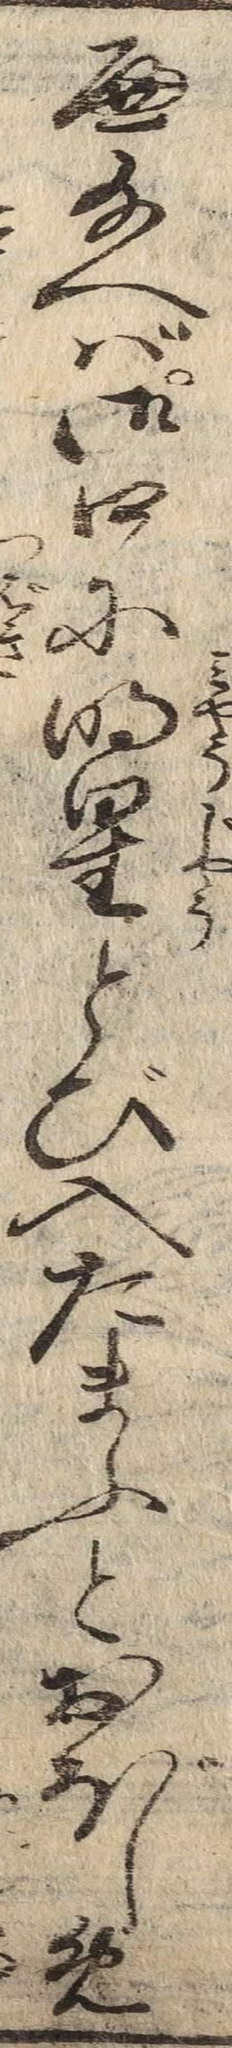へ給へば。御口に明星とび入たまふとおぼしめ
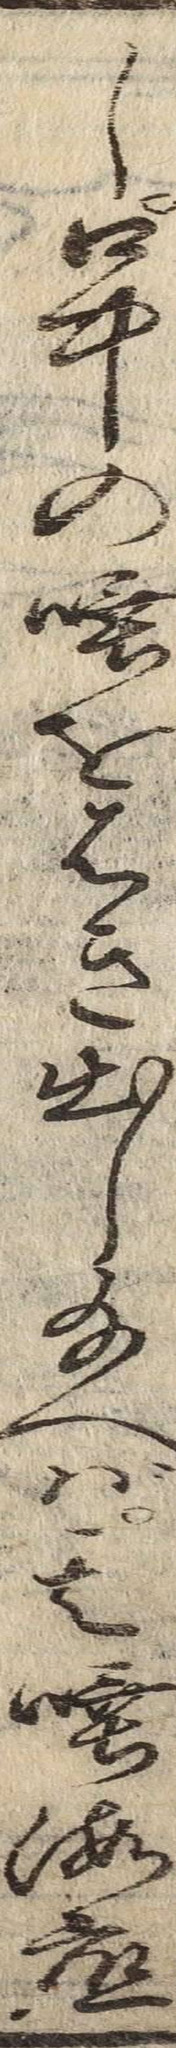し。口中の唾をはき出し給へば。其唾海底
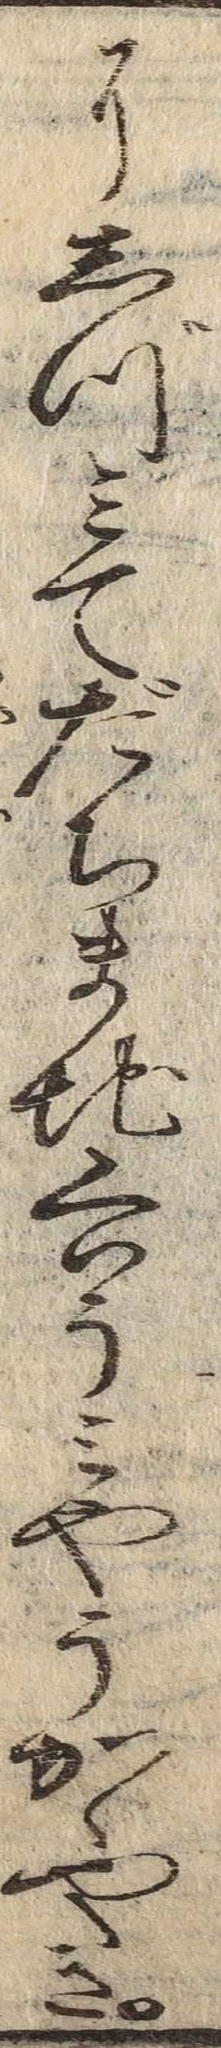にしづみて。たちまちくわうみやうかゝやき。
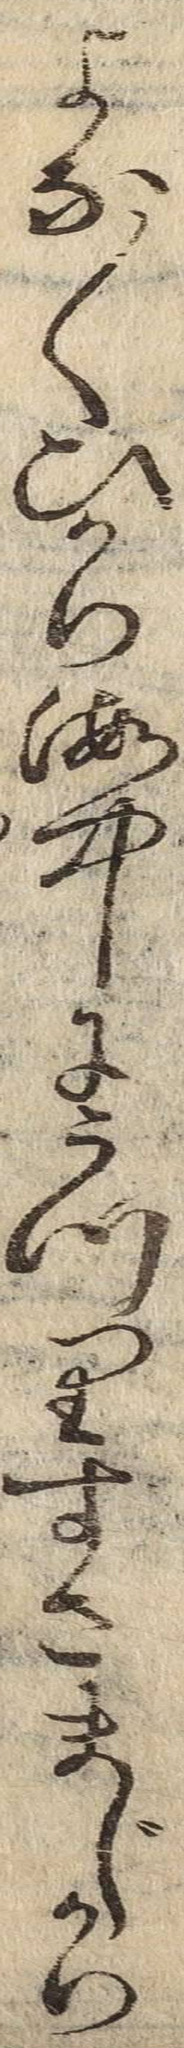よな〳〵ひかり海中にうつりすさまじかり
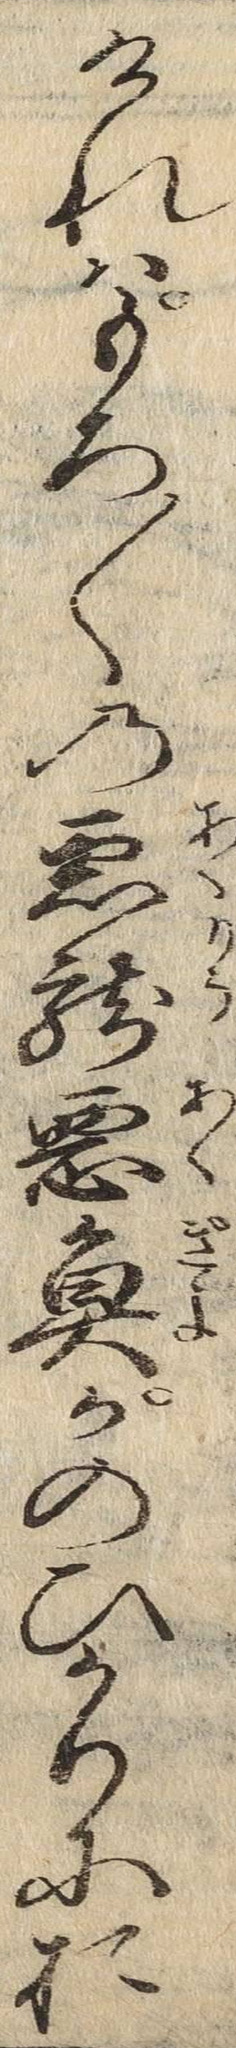けれは。もろ〳〵の悪龍悪魚。かのひかりにお
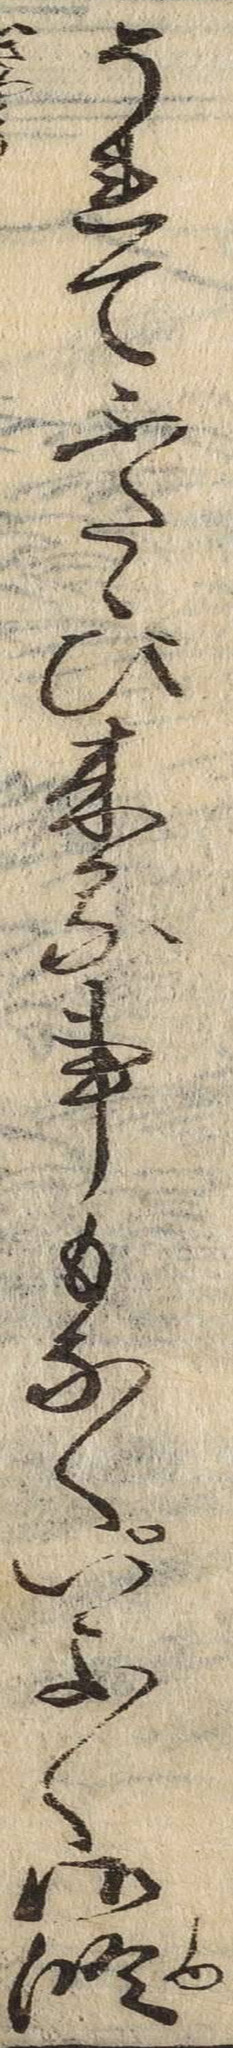それてふたゝび来る事もなく。いよ〳〵御修
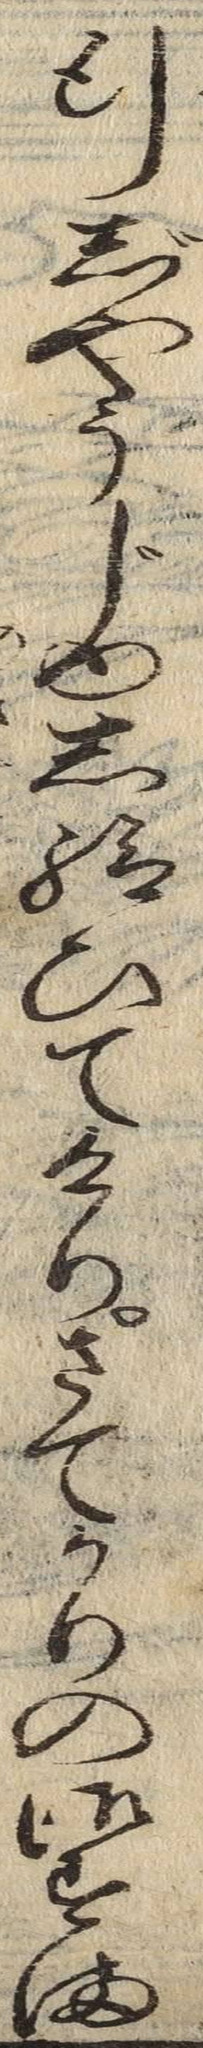行じやうじゆし給ひてけり。さてかりの御すま
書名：弘法大師御傳記
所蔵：京都府立京都学・歴彩館 国文学研究資料館
